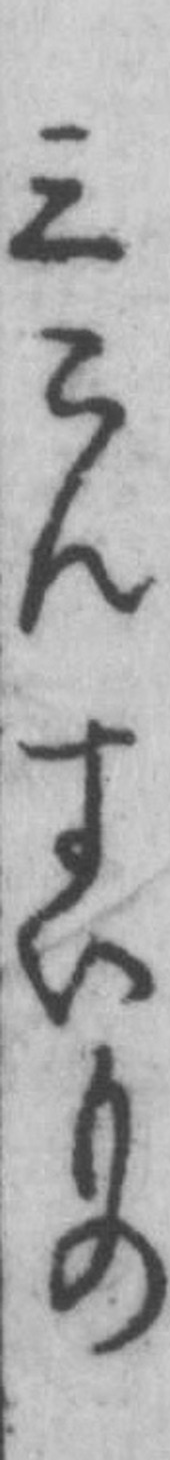三こんすいもの
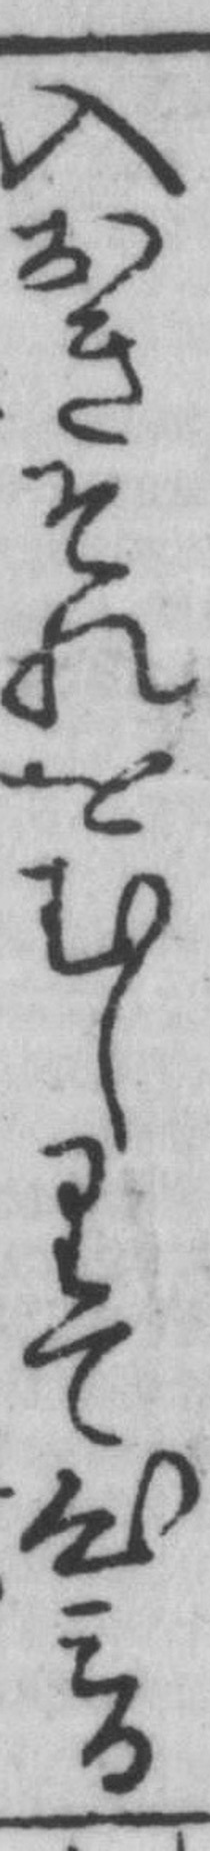入おきそれをむしりて心ミる
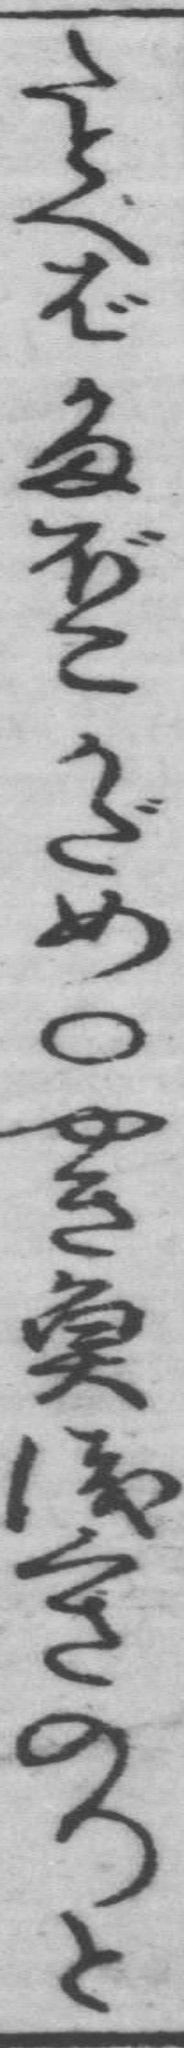たとへばかまぼこかだめ〇やき魚浅くさのりと
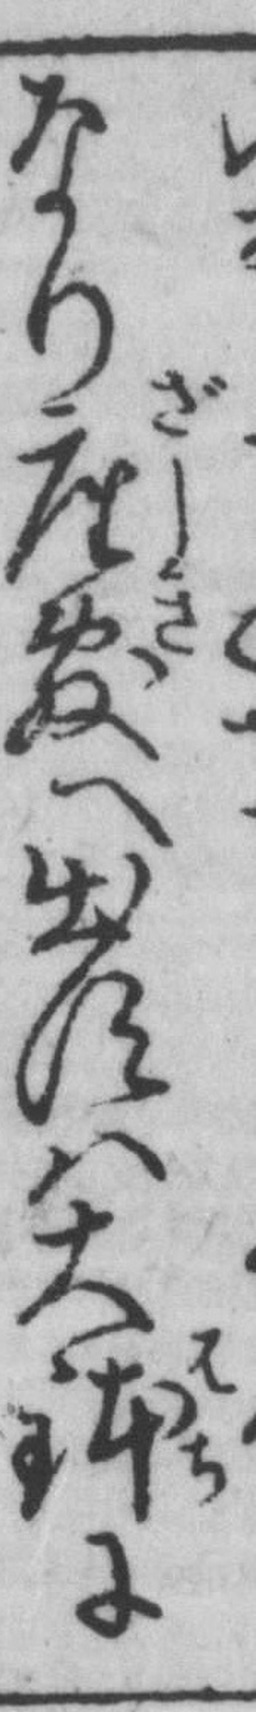なり座敷へ出すハ大鉢に
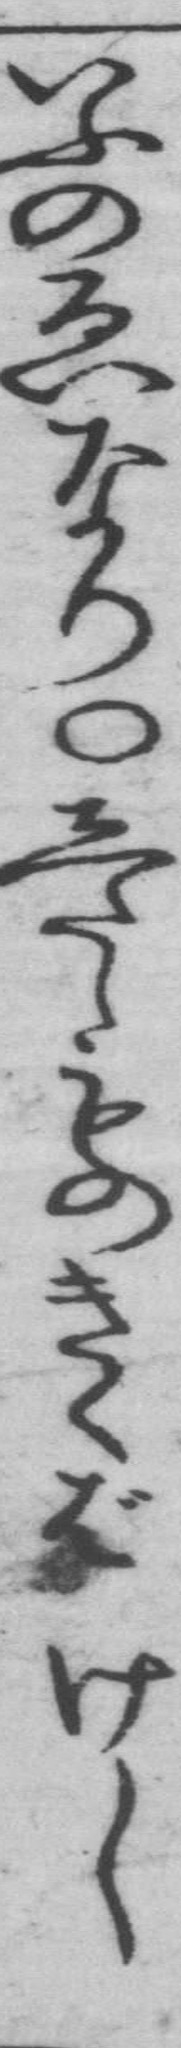いふのるいなり〇したしものきくばけし
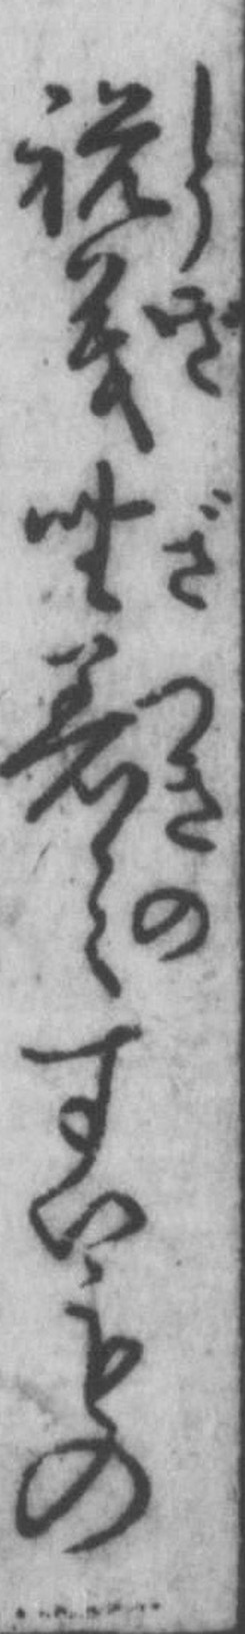祝儀座着のすいもの
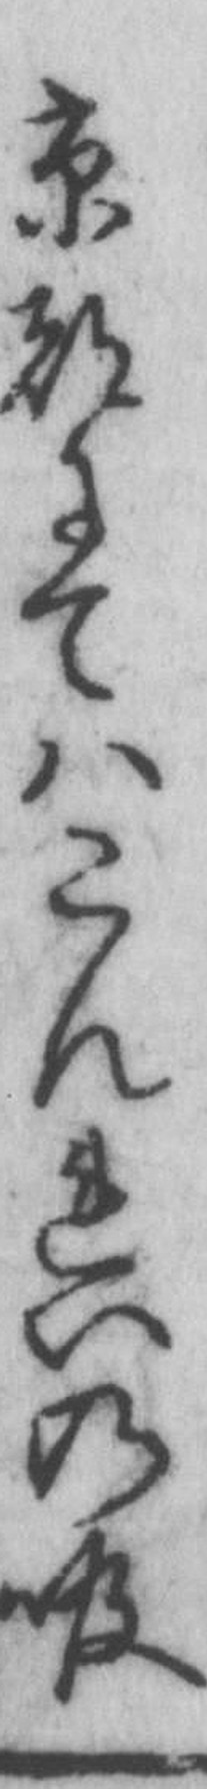京都にてハこんれいの使
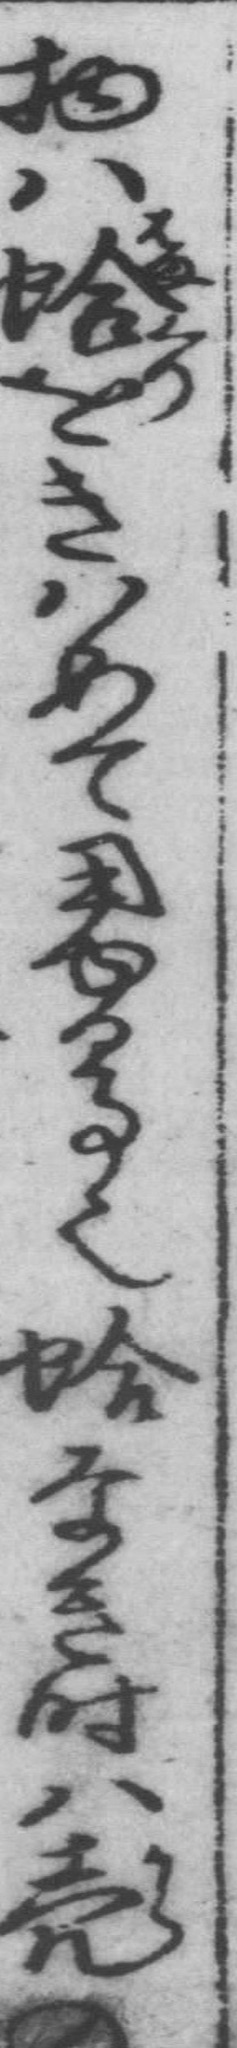物は蛤をきハめて用ゆる也蛤なき時ハ売りの
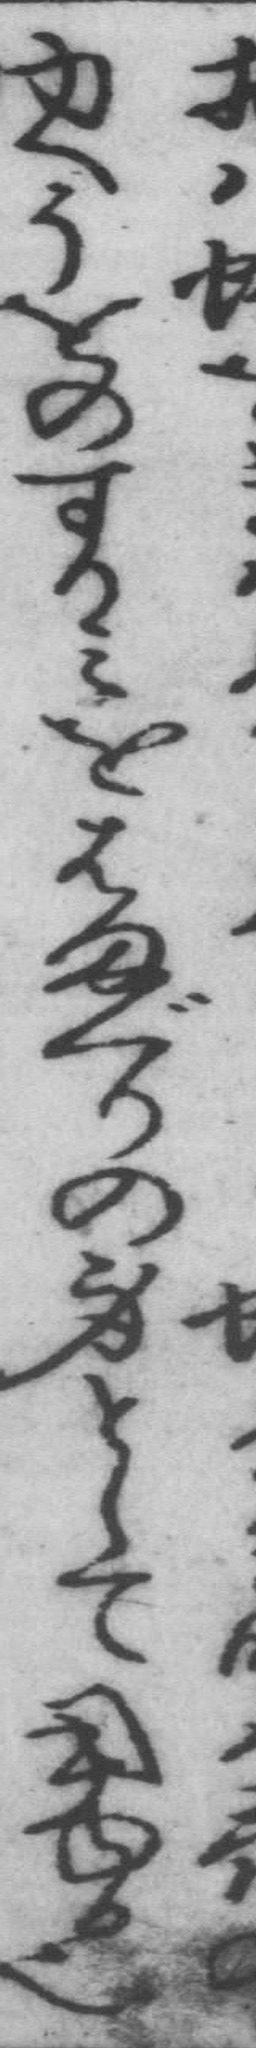内へうをのすりミをはまぐりの身として用ゆ也
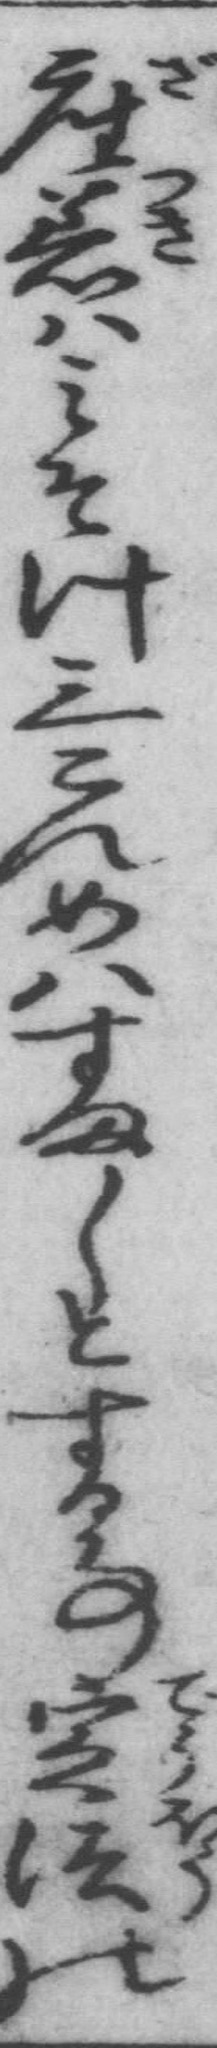座着ミそ汁三こんめハすましとする定法の
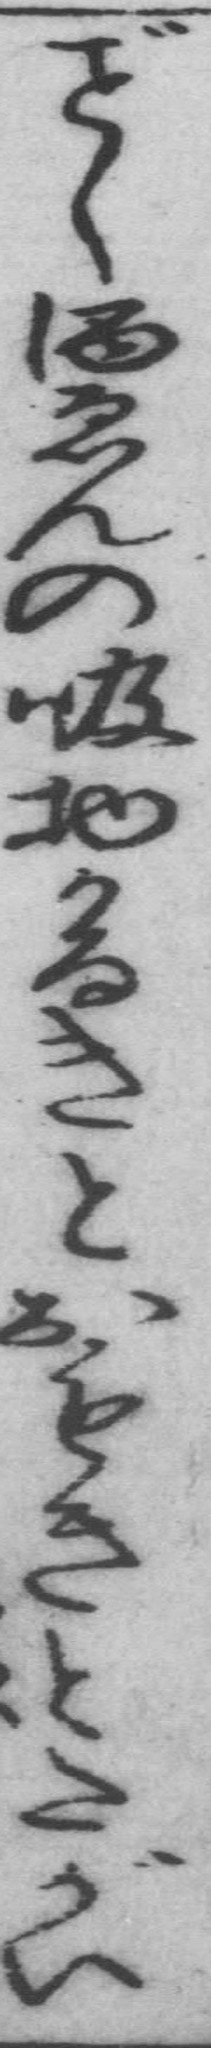ごとく酒ゑんの吸物かるきとおもきとたがい
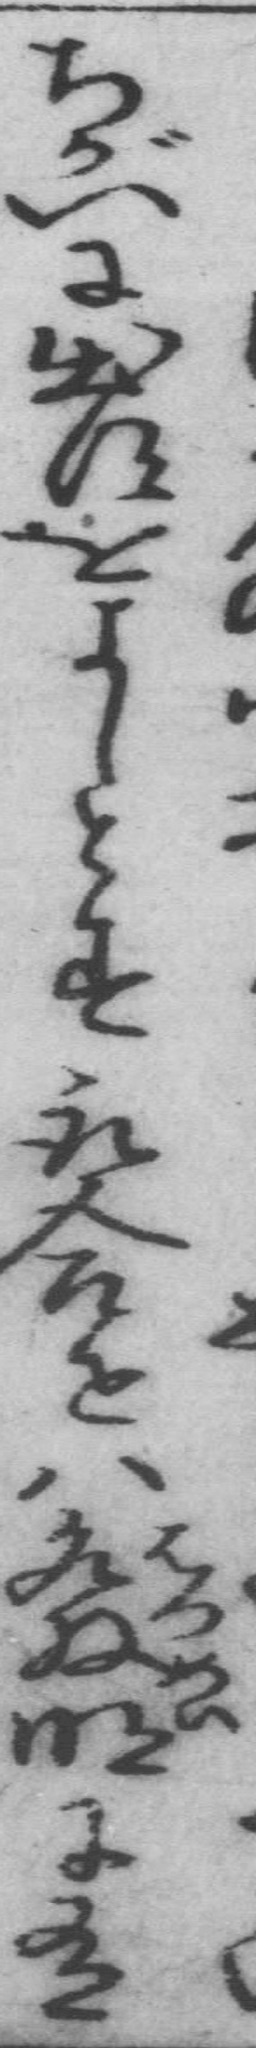ちがいに出すをよしとす取合ハ発明に
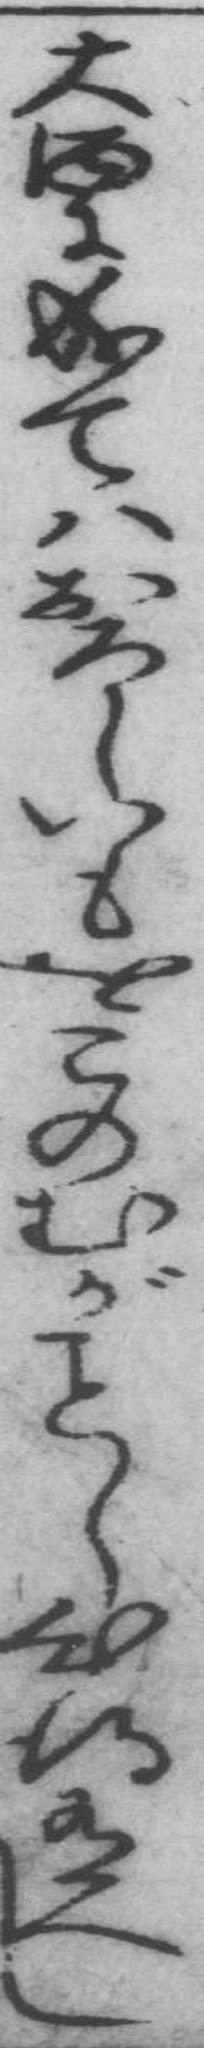大ゆに加てハおろしいもをこのむがことし但にかへし
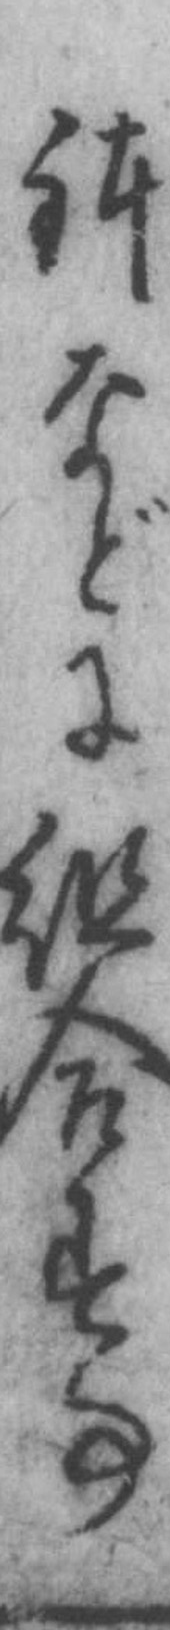鉢などに組合する
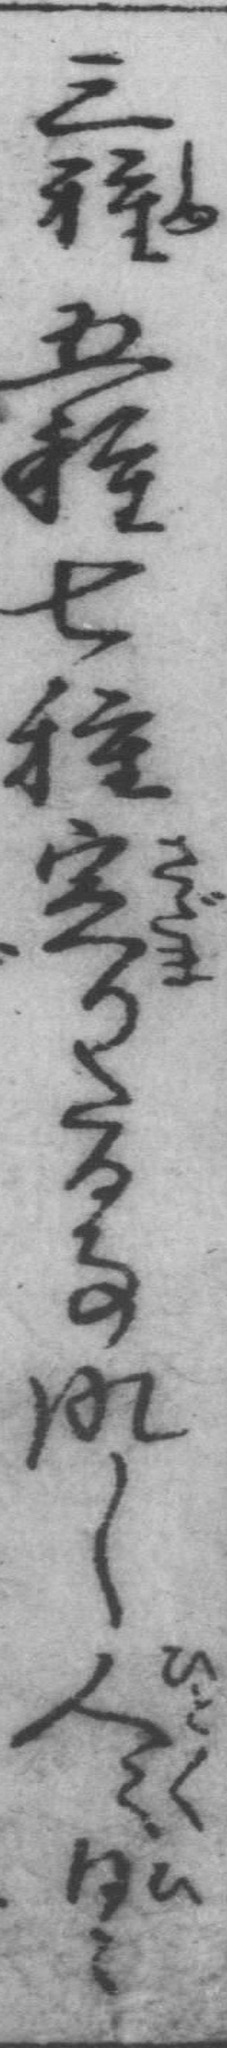三種五種七種定りたるなし人々日々
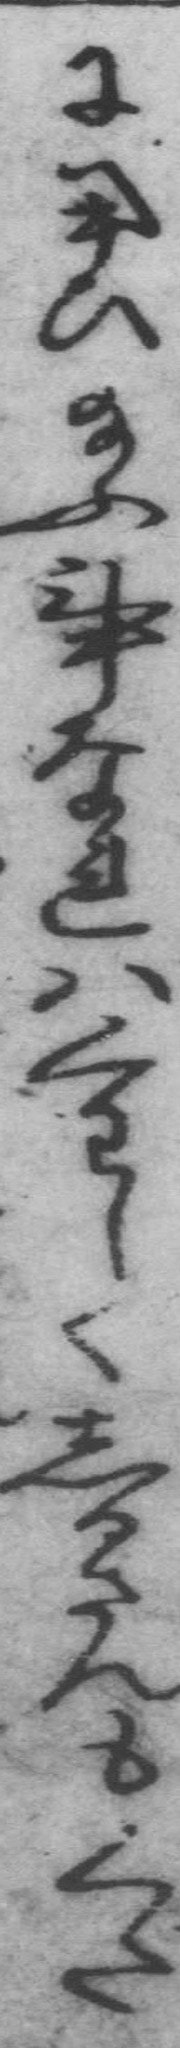に用ひ遣ふ事なれバくわしくしるさんもくだ
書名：料理献立抄
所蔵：大阪府立大学学術情報センター 国文学研究資料館
